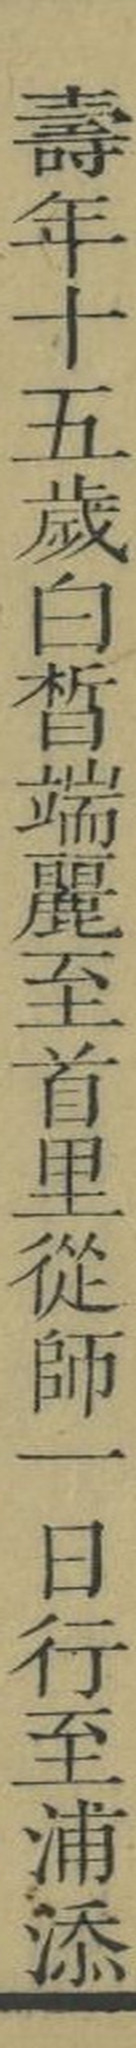壽年十五歲白晳端麗至首里從師一日行至浦添
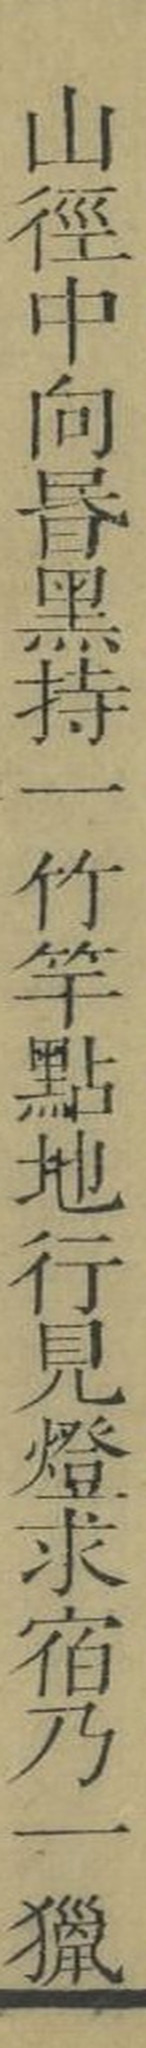山徑中向昬黑持一竹竿點地行見燈求宿乃一獵
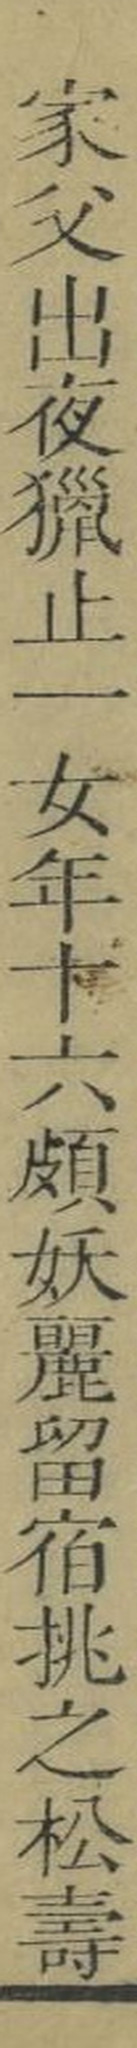家父出夜獵止一女年十六頗妖麗留宿挑之松壽
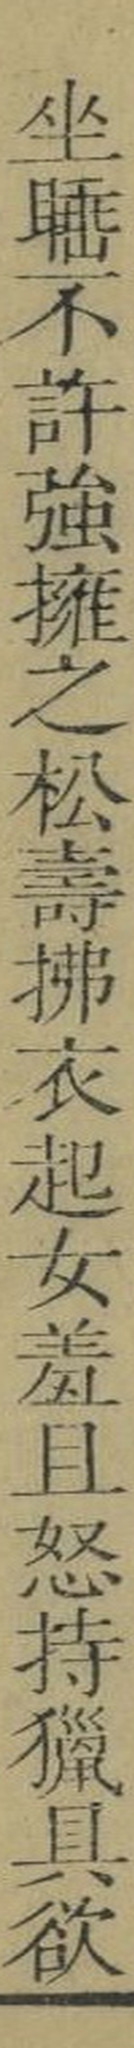坐睡不許強擁之松壽拂衣起女羞且怒持獵具欲
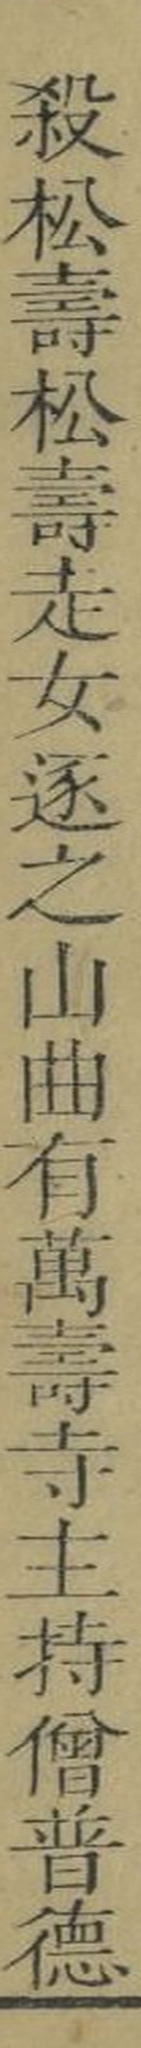殺松壽松壽走女逐之山曲有萬壽寺主持僧普德

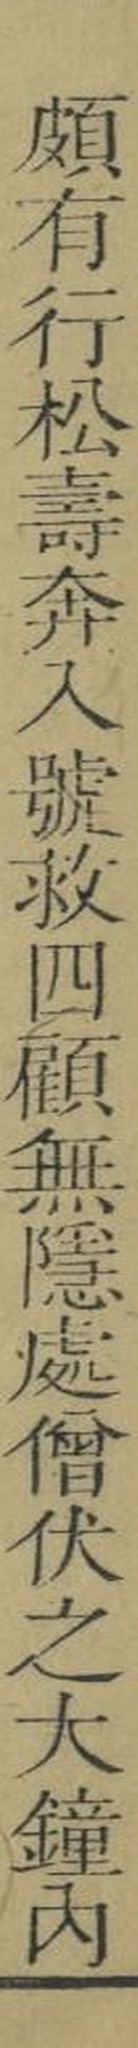頗有行松壽奔入號救四顧無隱處僧伏之大鐘内
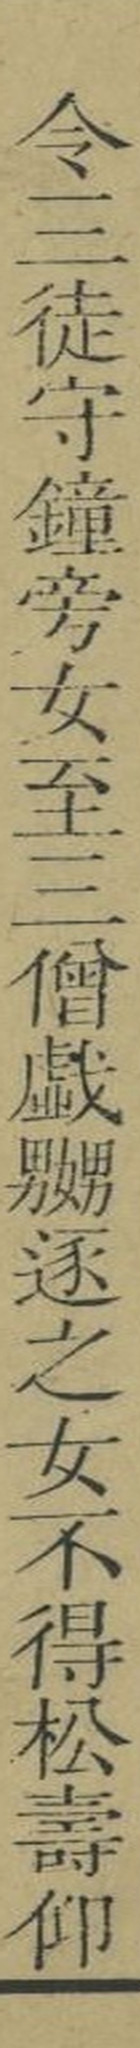令三徒守鐘旁女至三僧戱嬲逐之女不得松壽仰
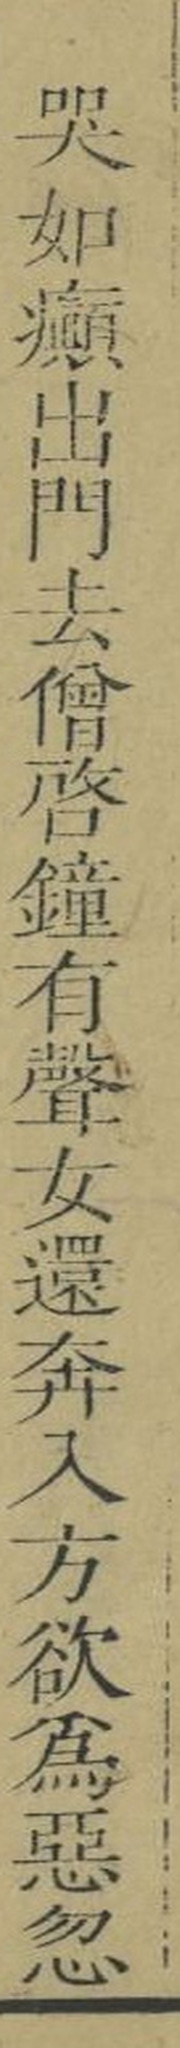哭如癲出門去僧啓鐘有聲女還奔入方欲爲惡忽
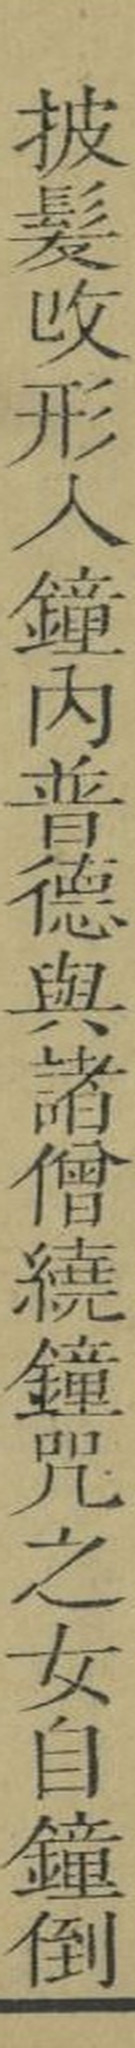披髪攺形入鐘内普德與諸僧繞鐘咒之女自鐘倒
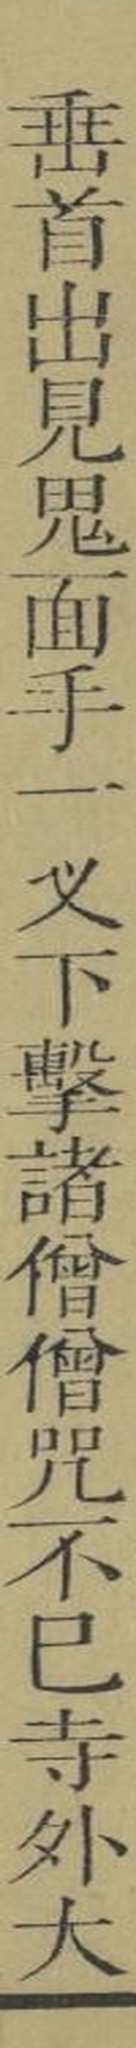垂首出見鬼面手一叉下擊諸僧僧咒不巳寺外大
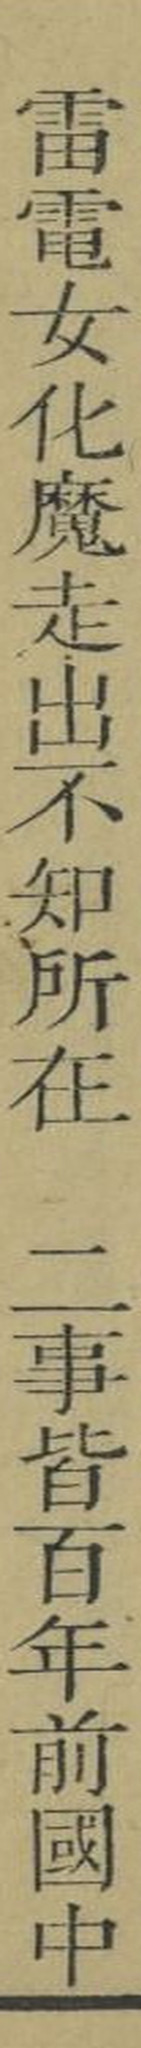雷電女化魔走出不知所在二事皆百年前國中
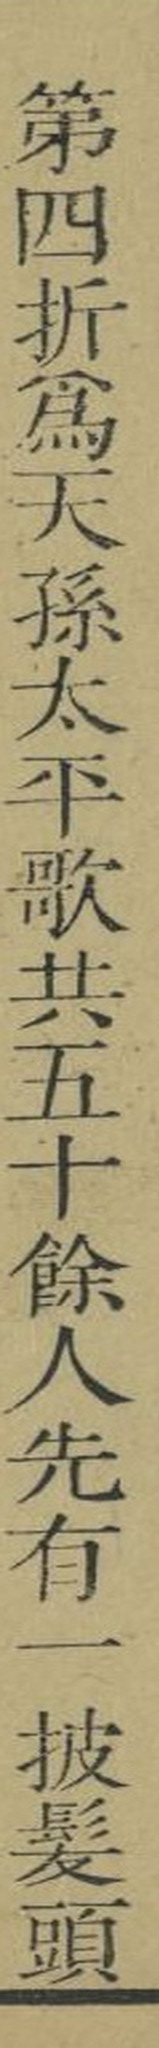第四折爲天孫太平歌共五十餘人先有一披髪頭
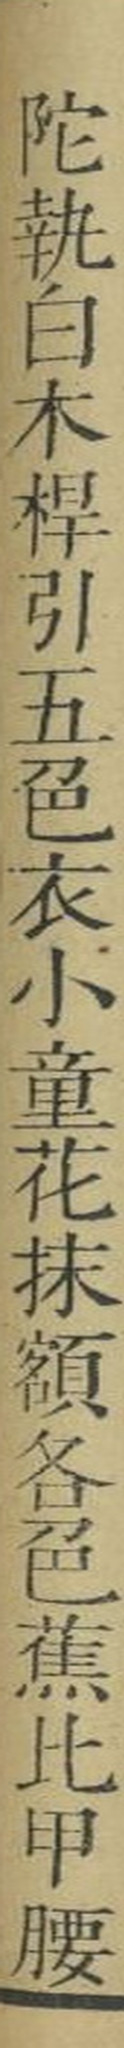陀執白木桿引五色衣小童花抹額各色蕉比甲腰
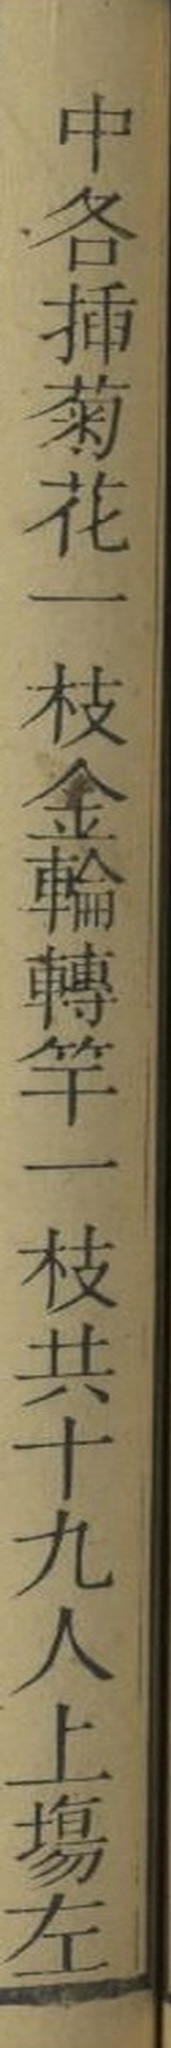中各揷菊花一枝金輪轉竿一枝共十九人上塲左
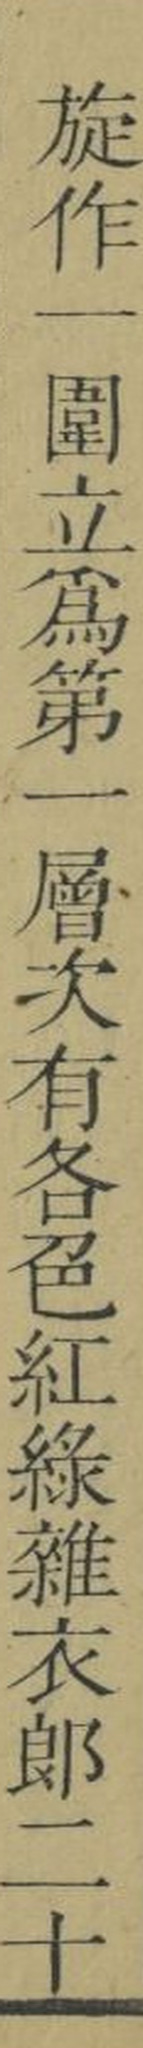旋作一圍立爲第一層次有各色紅綠雜衣郎二十
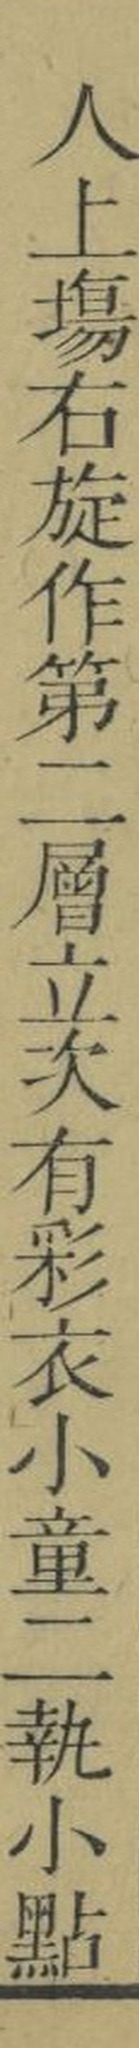人上塲右旋作第二層立次有彩衣小童二執小點
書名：中山伝信録 巻二
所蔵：University of the Ryukyus Library
